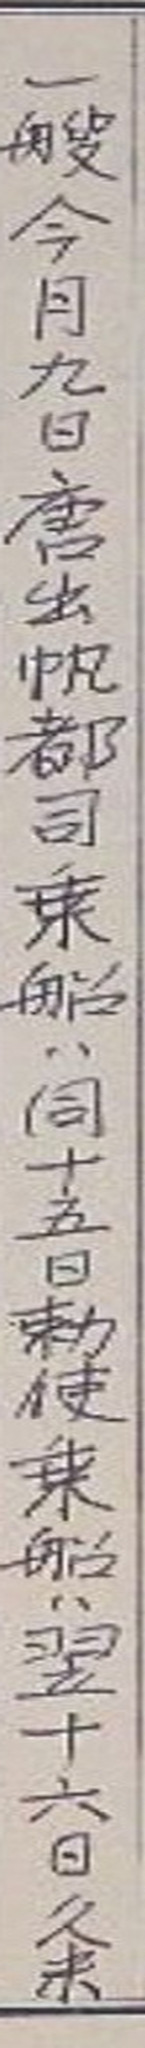一艘今月九日唐出帆都司乗船は同十五日勅使乗船は翌十六日久米
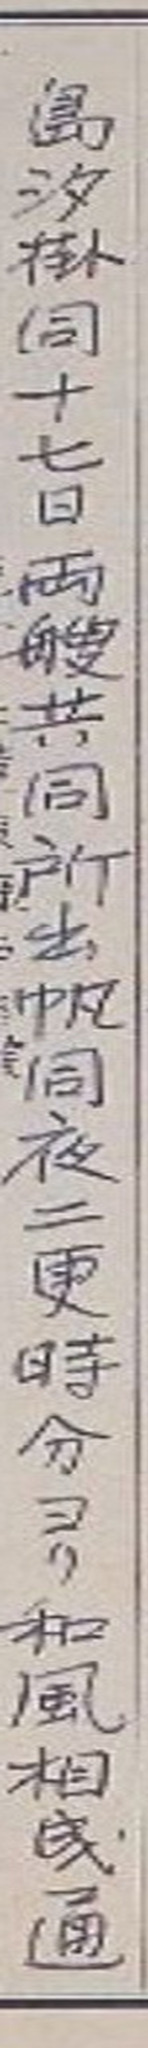島汐掛同十七日両艘共同所出帆同夜二更時分より和風相成通
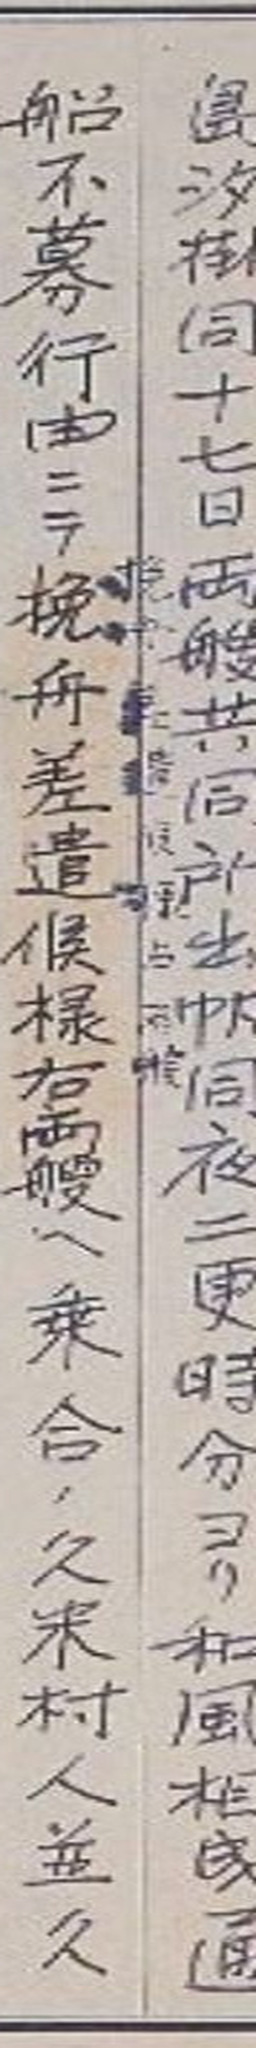船不募行由にて挽舟差遣候様右両艘へ乗合の久米村人並久
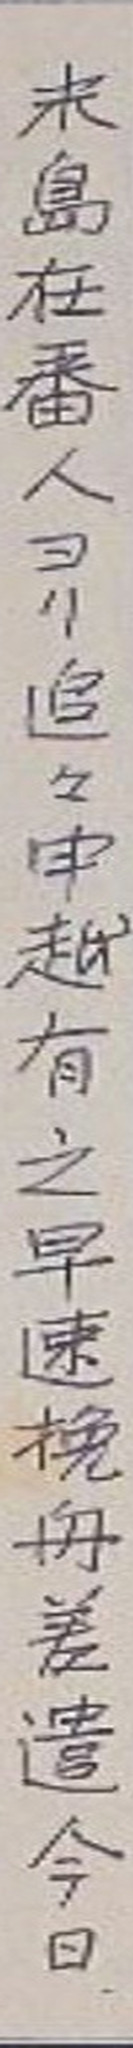米島相番人より追々申越有之早速挽舟差遣今日
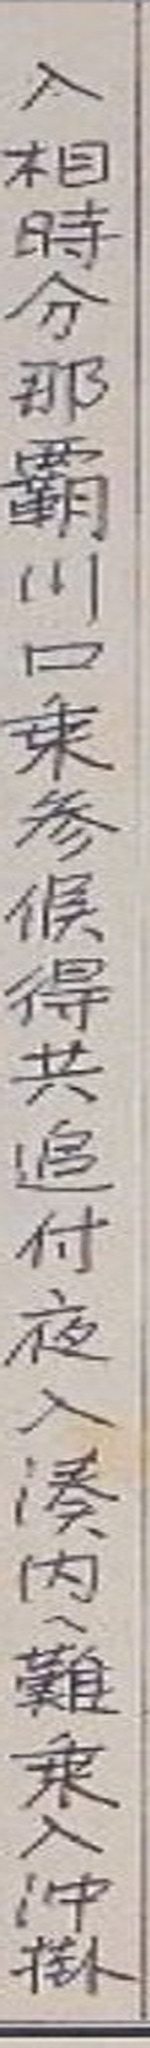入相時分那覇川口乗参候得共追付夜入湊内へ難乗入沖掛
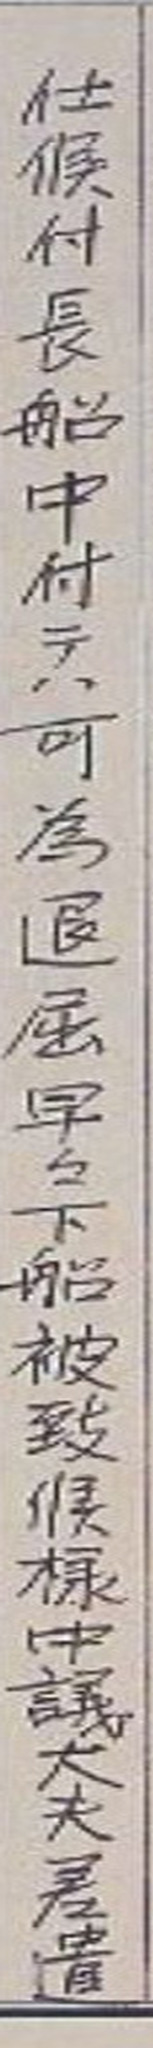仕候付長船中付ては可為退屈早々下船被致候様中議大夫差遣
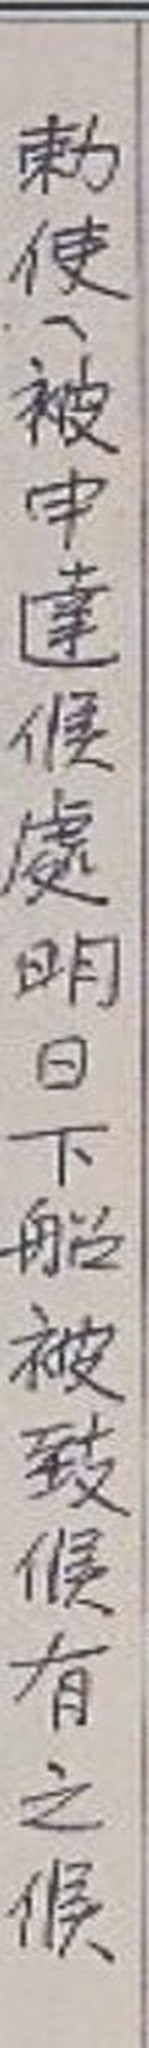勅使へ被申達候処明日下船被致候有之候
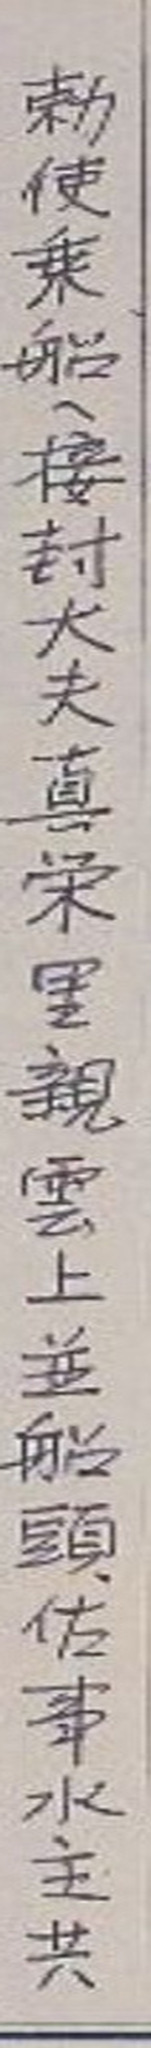勅使乗船へ接封大夫真栄里親雲上並船頭佐事水主共
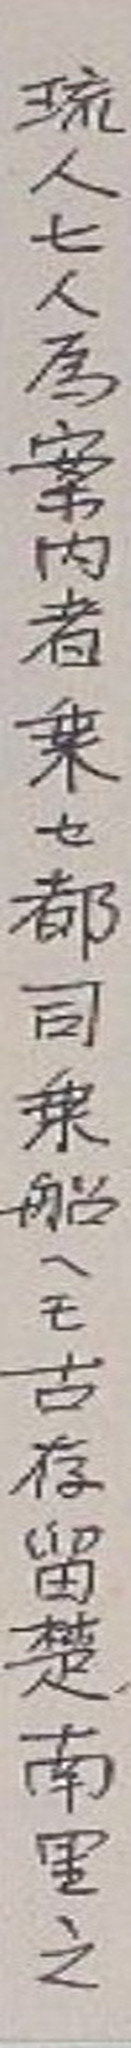琉人七人為案内者乗せ都司乗船へも古存留楚南里之
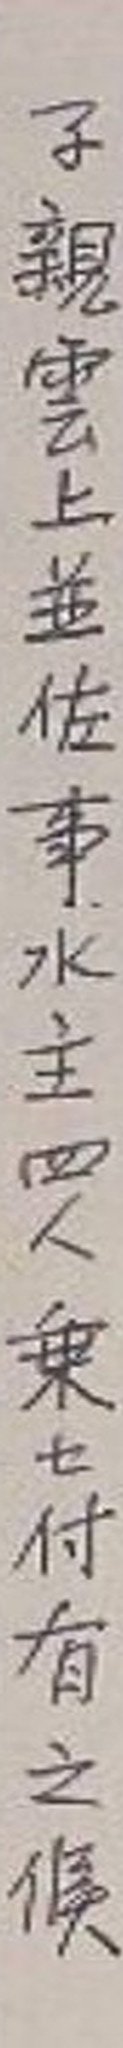子親雲上並佐事水主四人乗せ付有之候

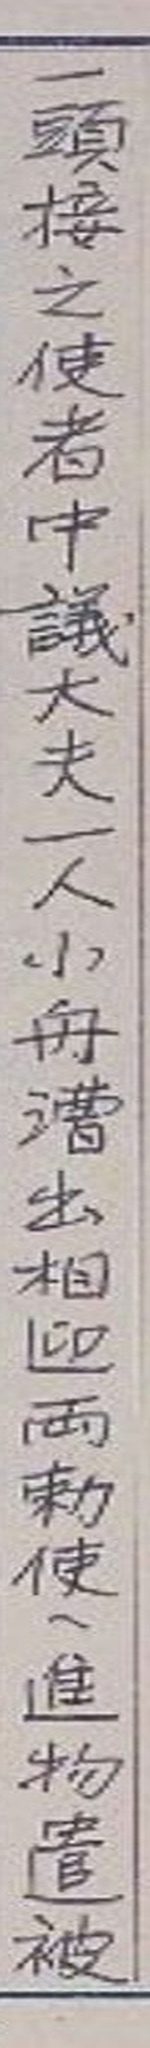一頭接之使者中議大夫一人小舟漕出相迎両勅使へ進物遣被
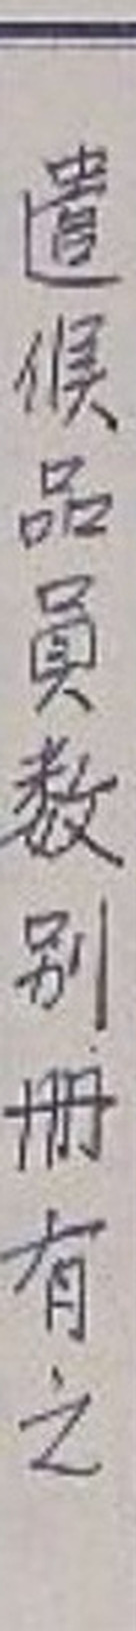遣候品員数別冊有之
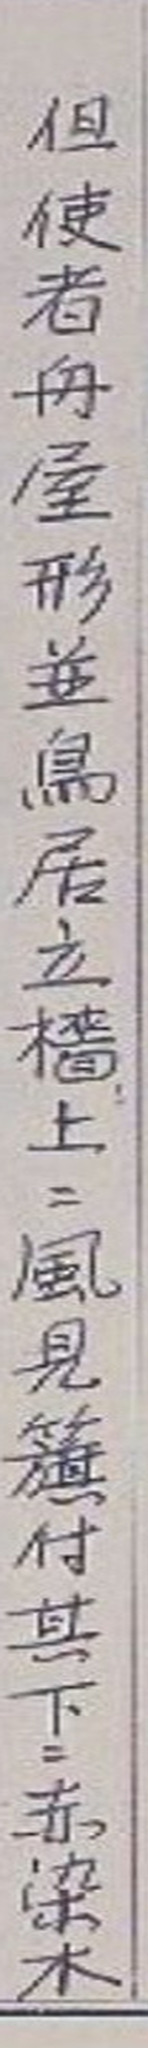但使者舟屋形並鳥居立檣上に風見旗付其下に赤染木
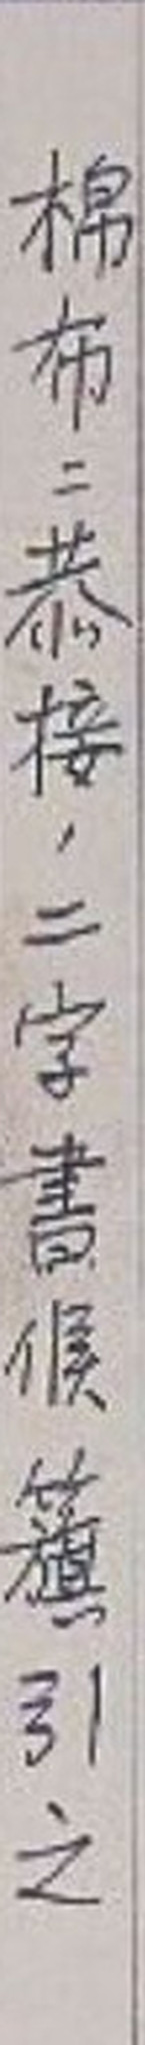棉布に恭接の二字書候旗引之
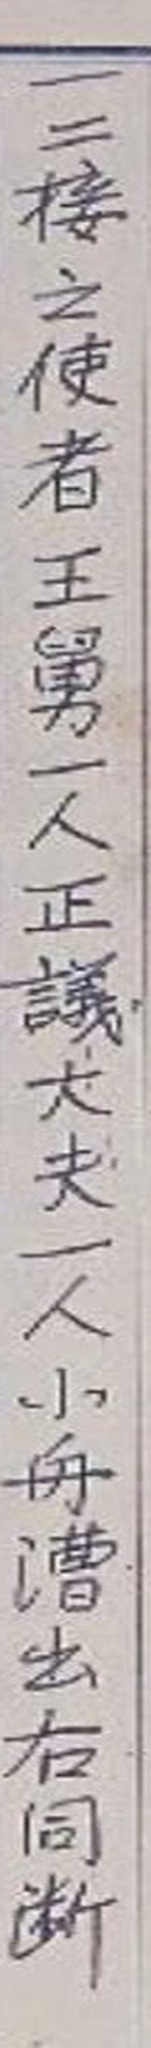一二接之使者王舅一人正議大夫一人小舟漕出右同断
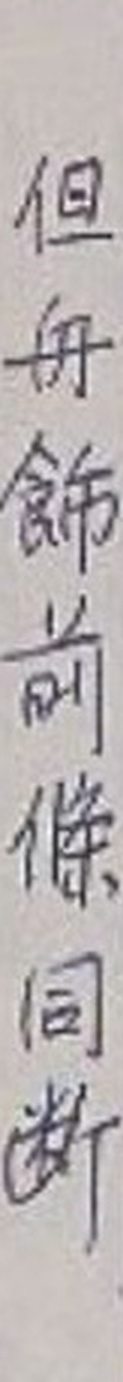但舟飾前条同断
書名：支那冊封使来琉諸記 下巻
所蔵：University of the Ryukyus Library
